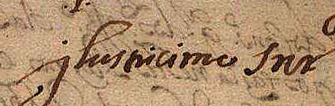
jlustricimo snr̄
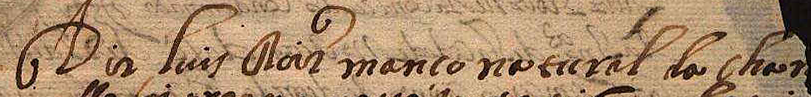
Diz luis Roiz̄ manço natural da Cha
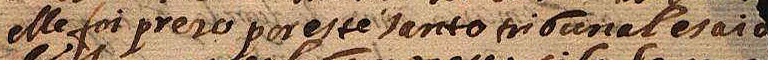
elle foi prezo por este santo tribunal e saio
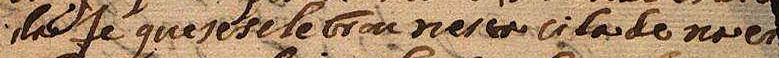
da fé que se selebrou nesta cidade na e_
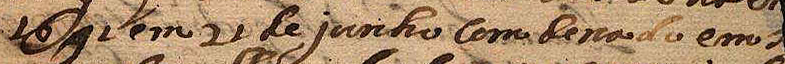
1691 em 21 de junho comdenado em
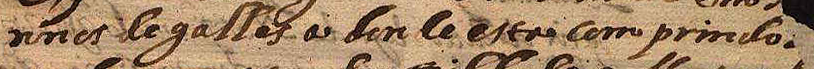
nnos de galles adonde esta comprindo
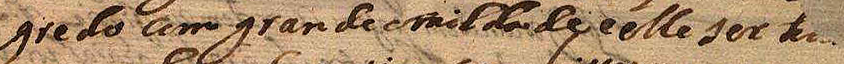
gredo com grande omildade e elle ser ho
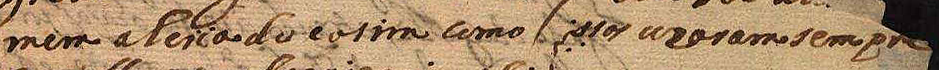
mem aleiiado e asim como V.s s.as uzaram sempre
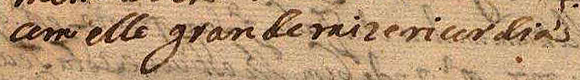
com elle grande mizericordia
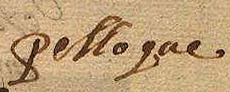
pello que
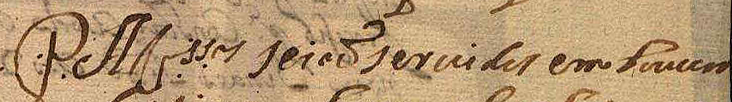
P. A V.s s.as seiaõ seruidos em louuor
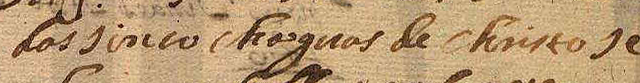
das sinco chaguas de Christo se
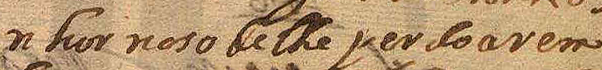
nhor noso de lhe perdoarem
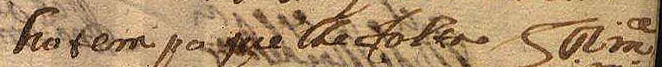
ho tempo que lhe falta E R. m.ce
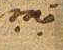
m
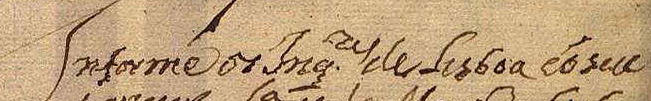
Jnformē os Inq.res de Lisboa cō seu
